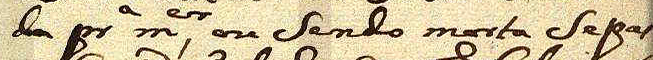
da pra mer, ou Sendo morta se pas
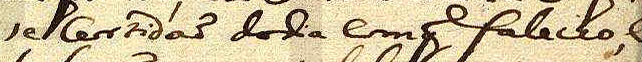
se certidaõ do dia em q̄ faleceo, e
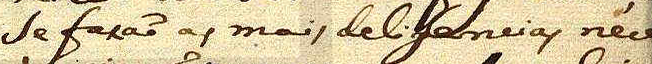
se faraõ as mais deligencias nece
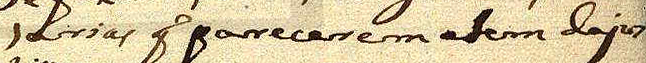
sarias q̄ parecerem a bem da jus
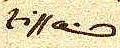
tissa.
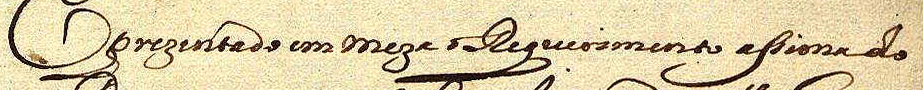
E prezentado em meza o Requerimento assima do
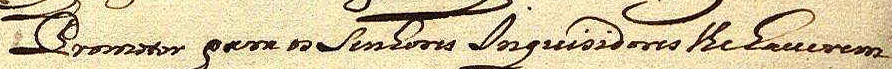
Promotor para os Senhores Inquisidores lhe hauerem
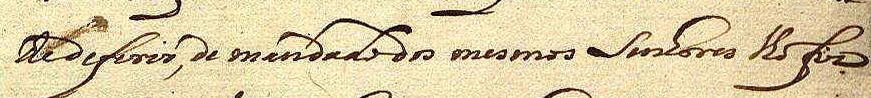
de deferir, de mandado dos mesmos Senhores lho fiz
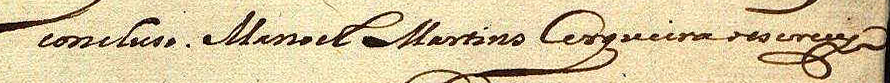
concluso. Manoel Martins Cerqueira o escreuj
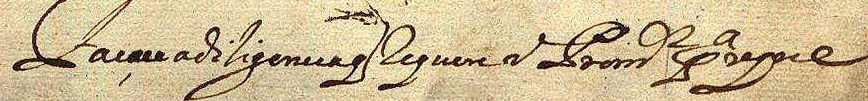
Façace a diligencia q̄ Requere o Promor pa o que
